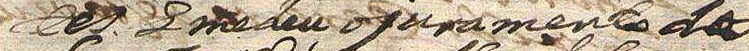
tes. E me deu o juramento dos
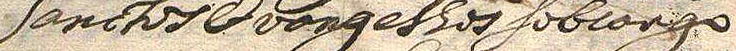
Sanctos Evangelhos sob cargo
